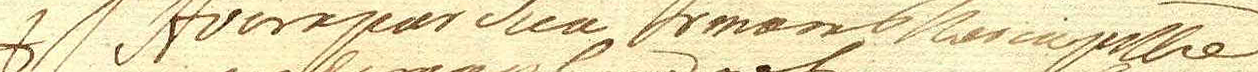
item Avera por sua Irmam Maria pello
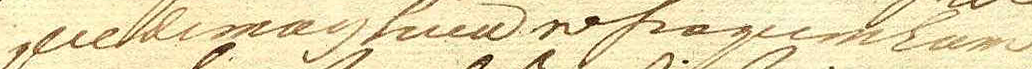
que de mais leua no seo quinham
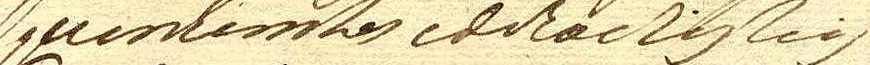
quinhentos e deZaseis Reis
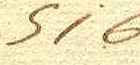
516
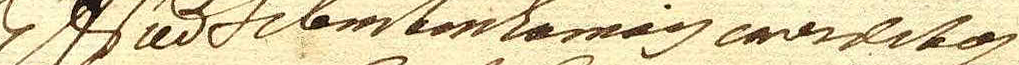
E Naõ se Comtinha mais em os ditos
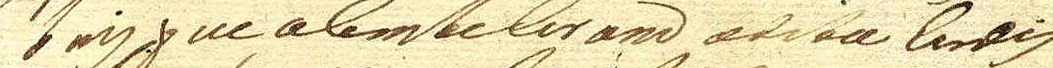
beis que aComteCeram a dita herdej
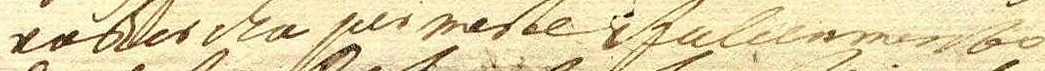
ra thereZa per morte e falecimento
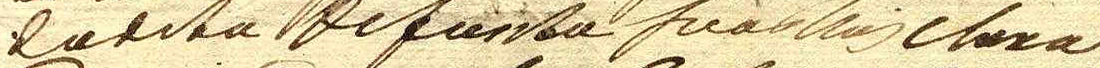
da dita Defunta sua Maj clara
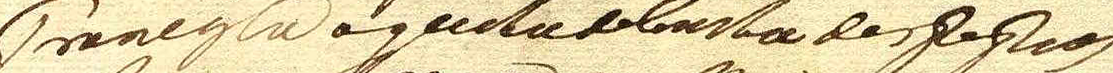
FrancisCa o que tudo Consta dos proprios
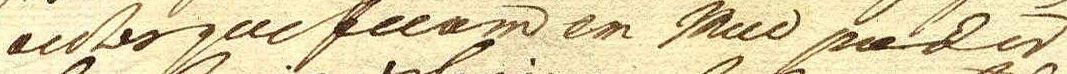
autos que ficam em Meu poder
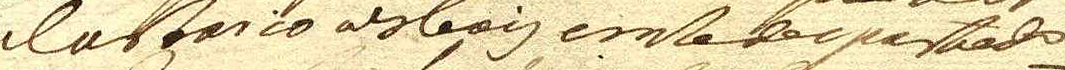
e Cartorio aos Coais em todo e por todo
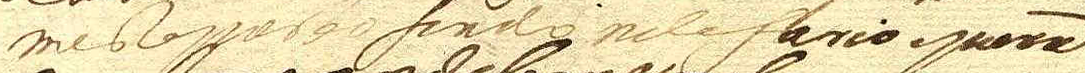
me Reporto sendo neCesario e para
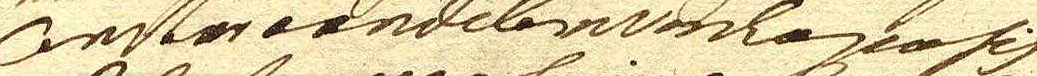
Constar aonde Convenha que fis
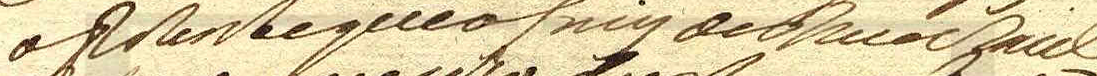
a preZente que assinej de Meu sinal
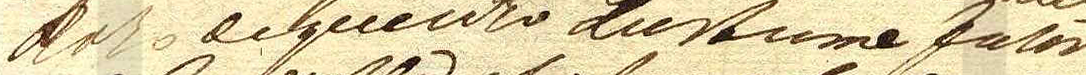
RaZo de que uZo e Custumo fazer
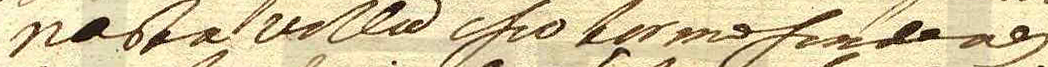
nesta villa e seo termo sendo aos
